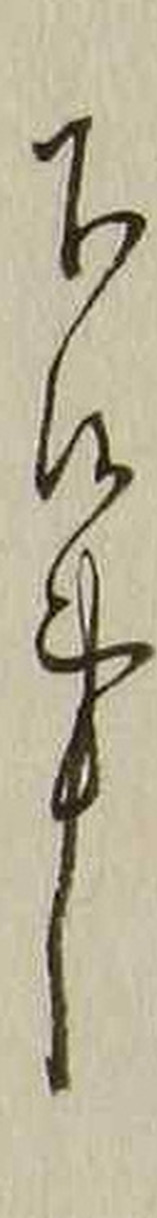下候事
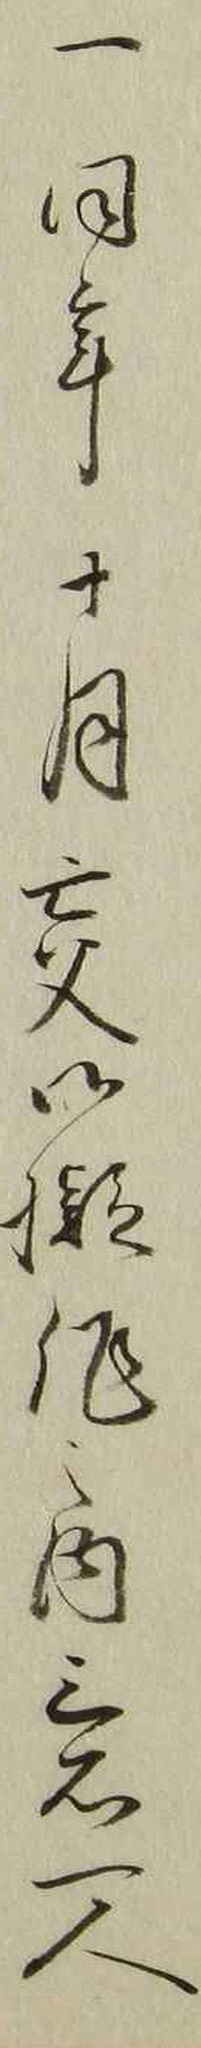一同年十月亡父御擬作之内三石一人
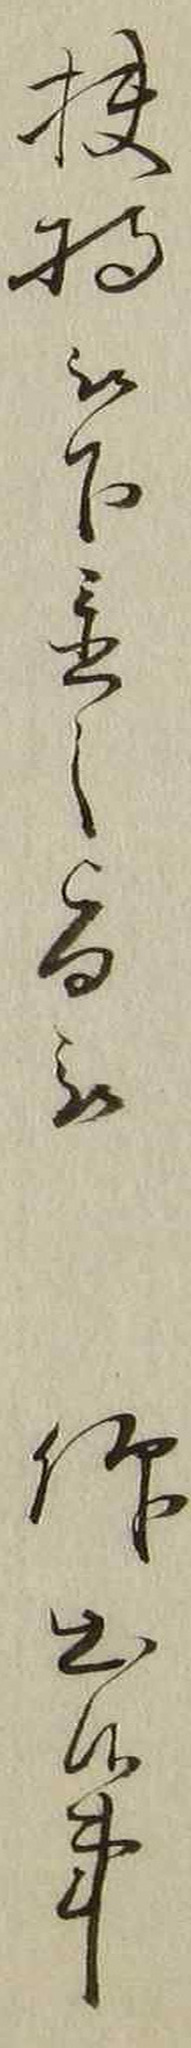扶持被下置之旨被仰出候事
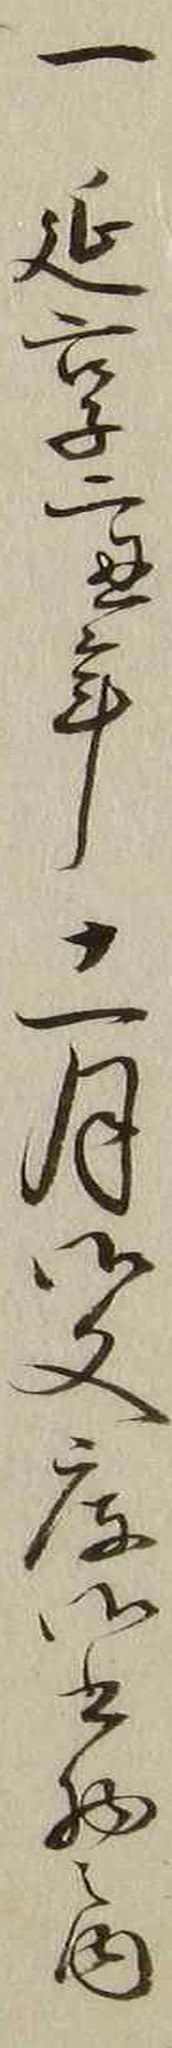一延享二丑年十一月御文庫御書物之内
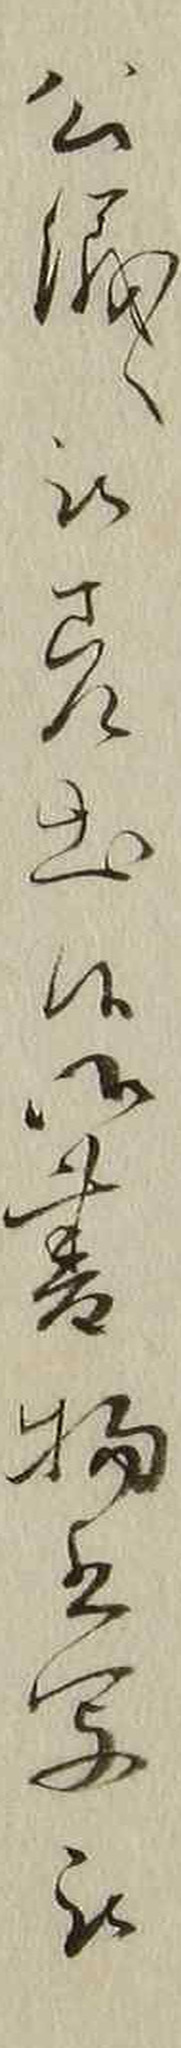公儀へ被差出候御書物書写被
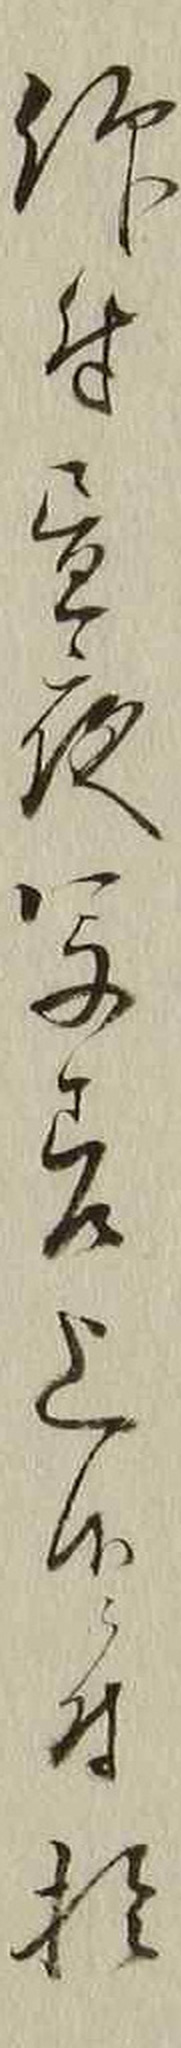仰付昼夜写差上候ニ付於
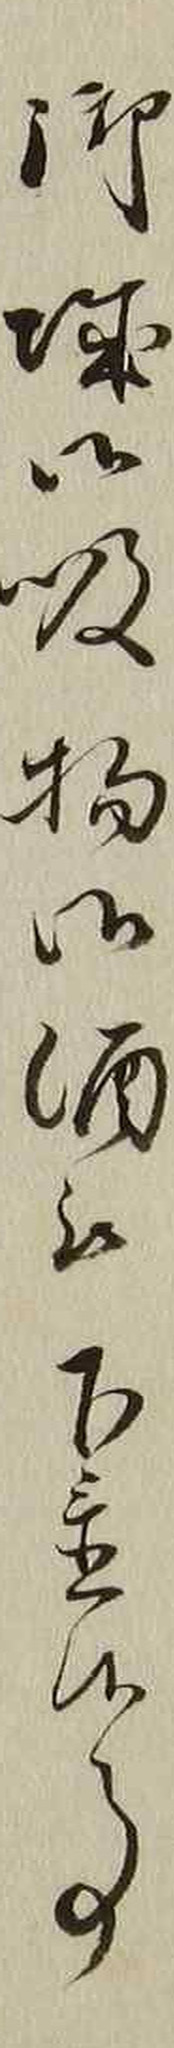御城御吸物御酒被下置候事
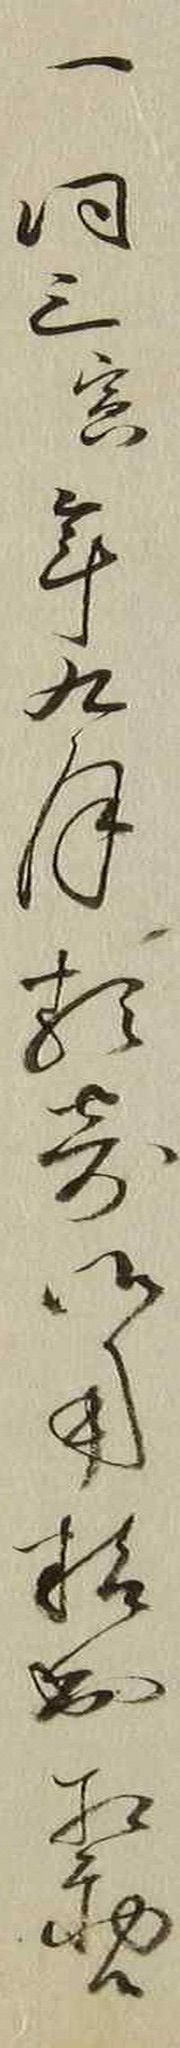一同三寅年九月類寄御用精出相勤候
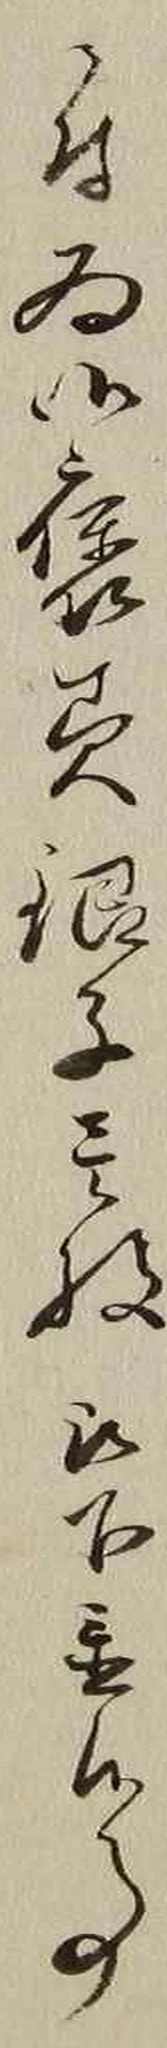ニ付為御褒美銀子壱枚被下置候事
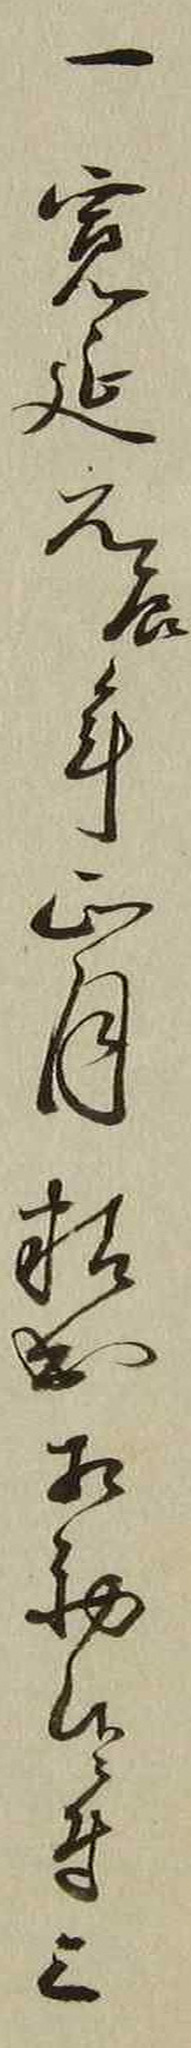一寛延元辰年正月精出相勤候ニ付三
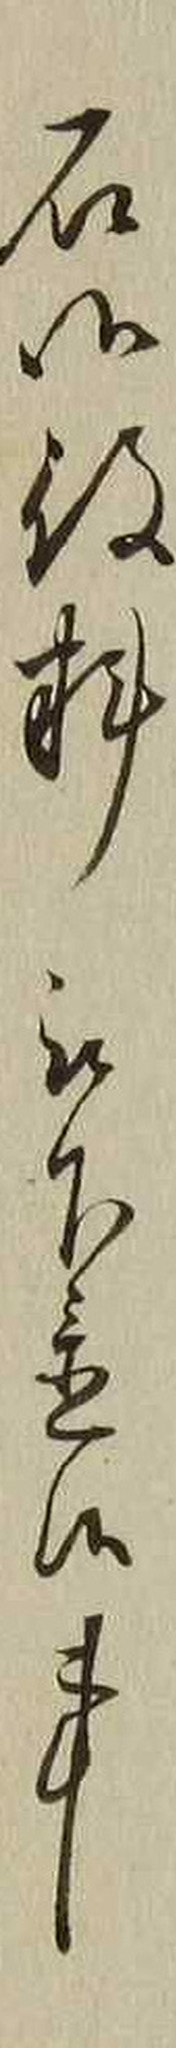石御役料被下置候事
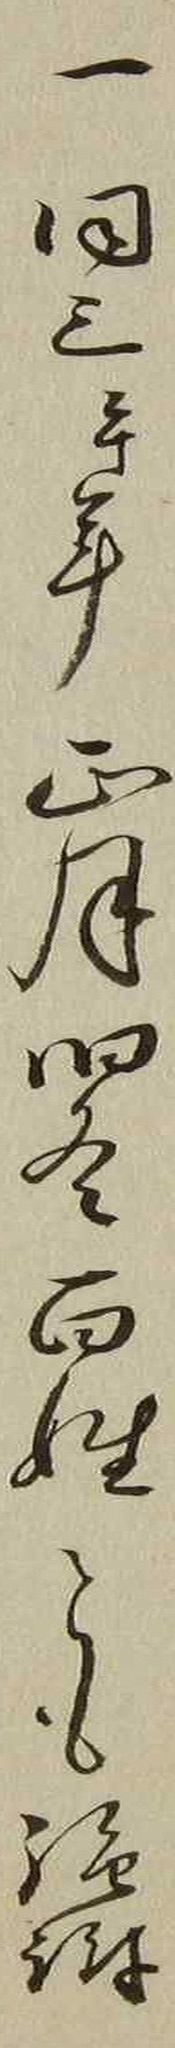一同三午年正月旧冬百姓とも強訴
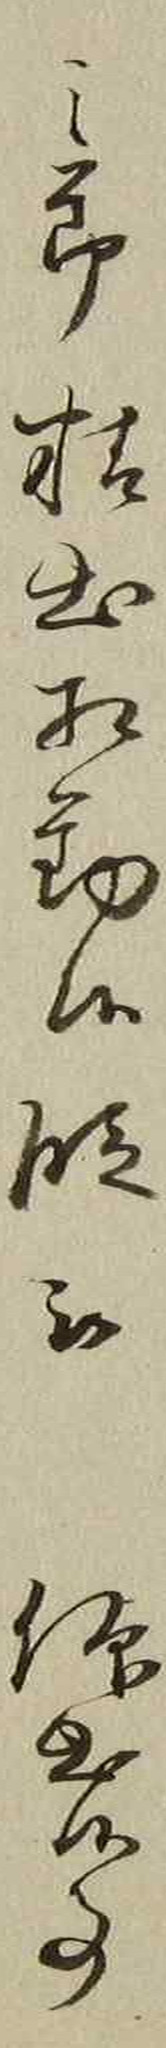之節精出相勤候段被仰出候事
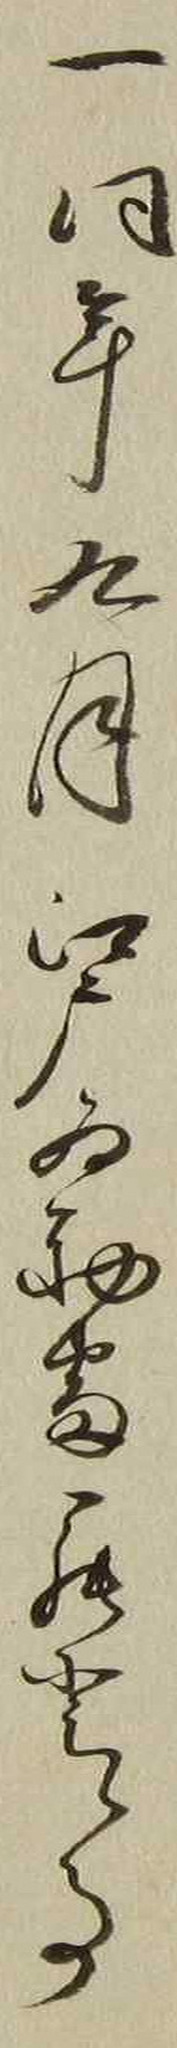一同年九月江戸為勤番罷登候事
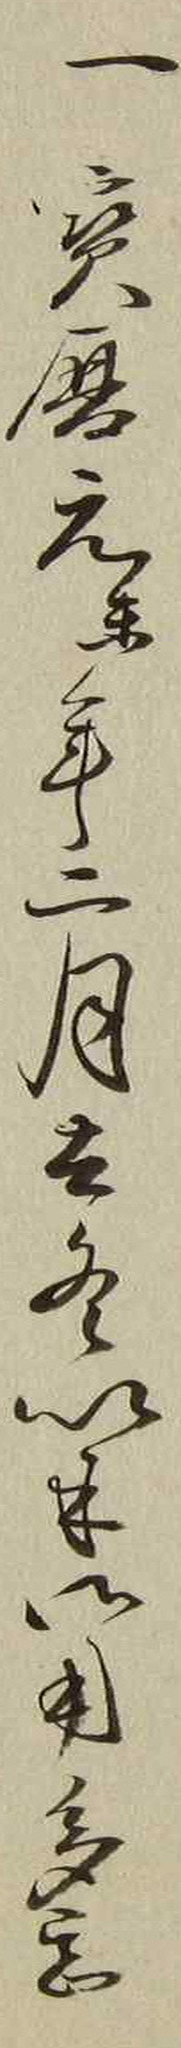一宝暦元未年二月去冬以来御用多甚
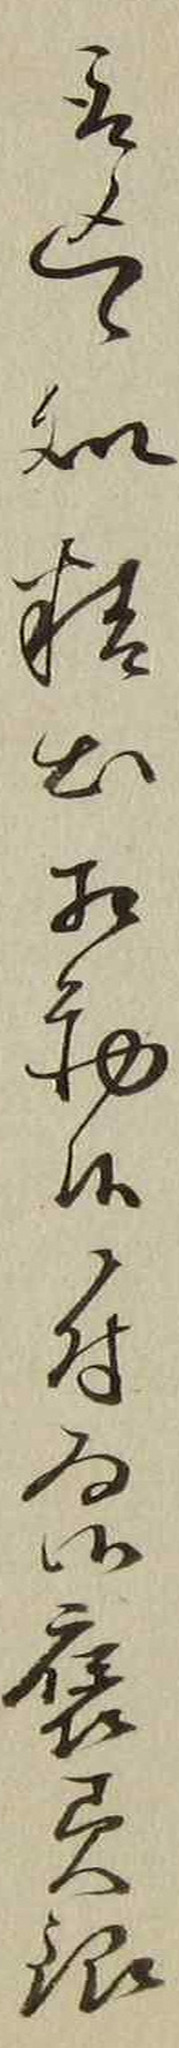取込候処精出相勤候ニ付為御褒美銀
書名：諸士系譜　巻之52　に之部3
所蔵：会津若松市立会津図書館
